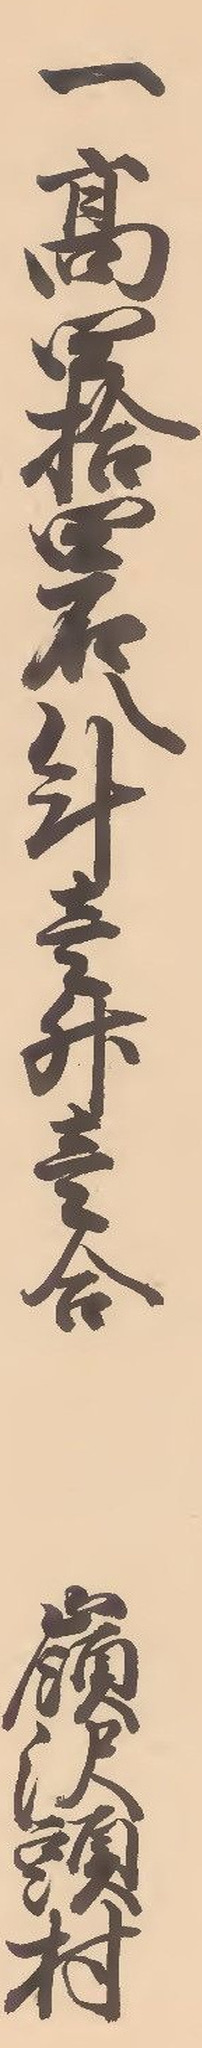一高四拾四石八斗壱升壱合嶺沢頭村
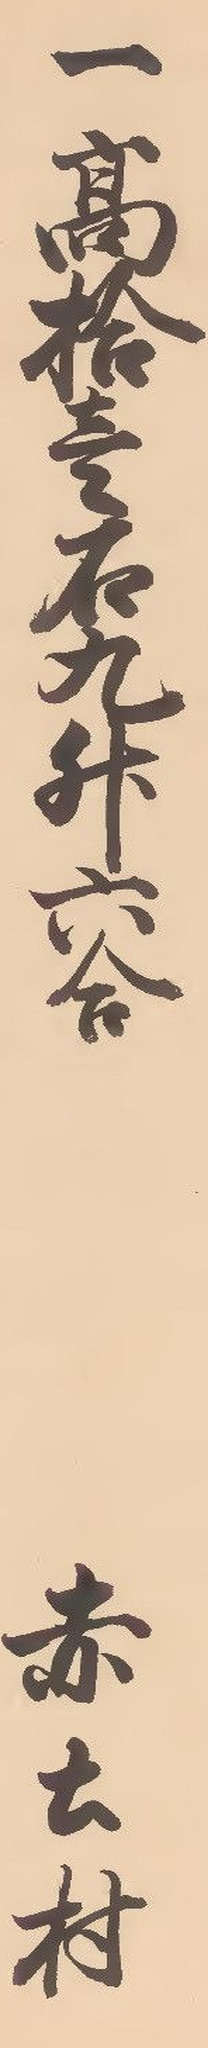一高拾壱石九升六合赤土村
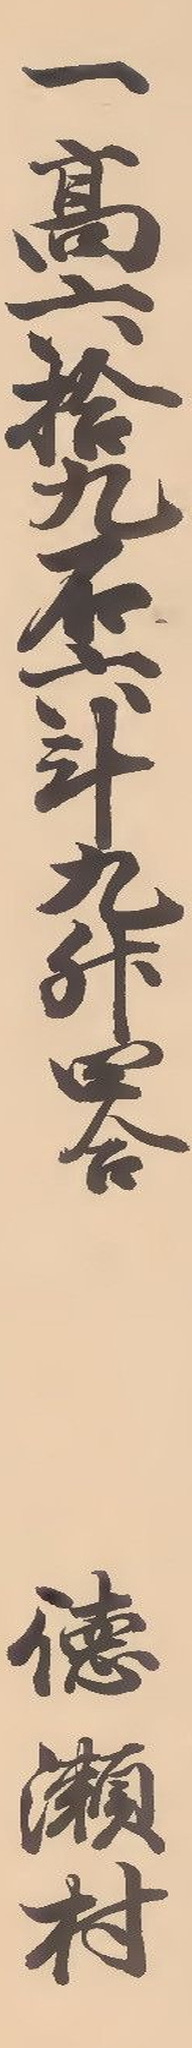一高六拾九石六斗九升四合徳瀬村
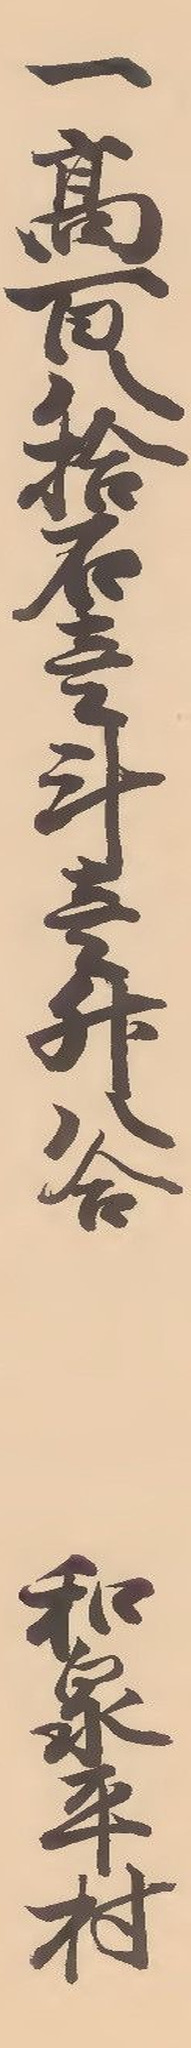一高百八拾石壱斗壱升八合和泉平村
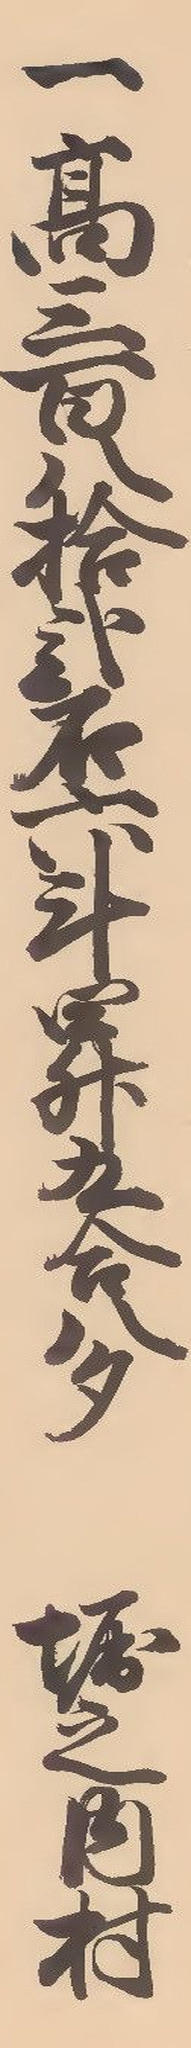一高三百拾弐石六斗四升九合八勺堀之内村

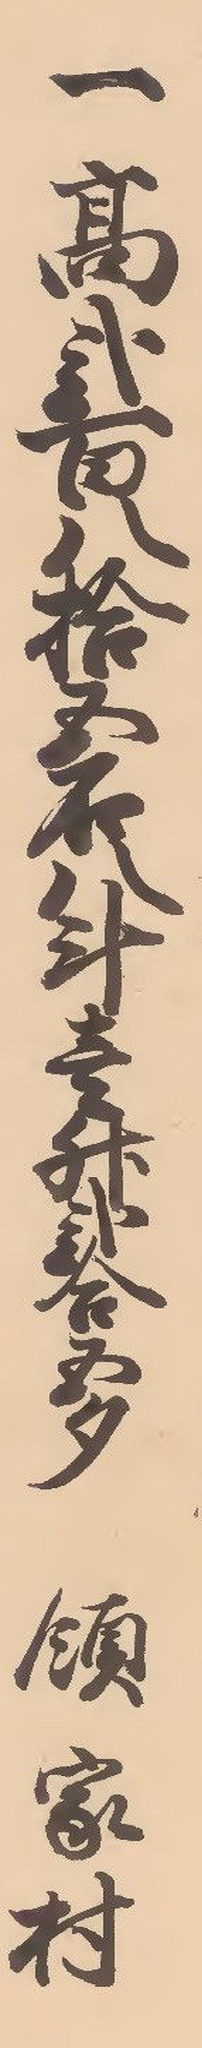一高弐百八拾五石八斗壱升弐合五勺領家村
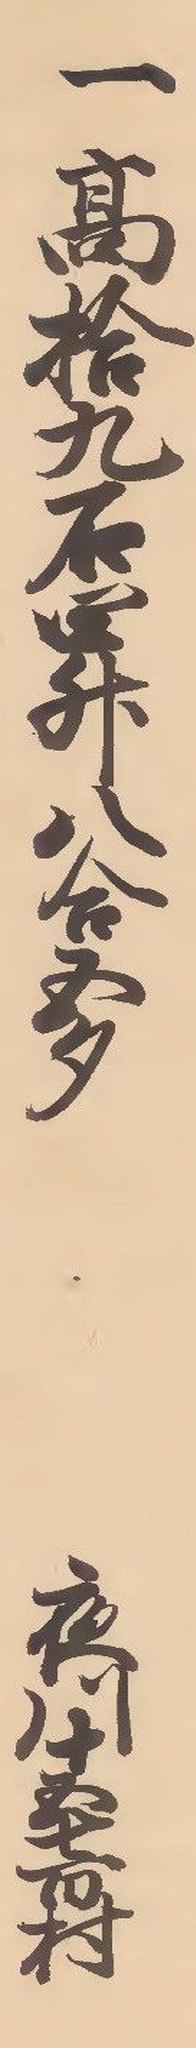一高拾九石四升八合五勺夜川十五七百村
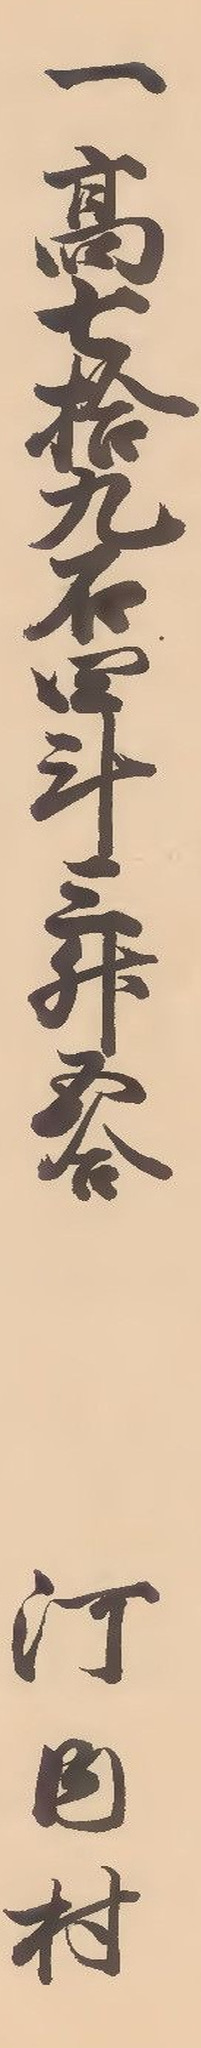一高七拾九石四斗三升五合河内村
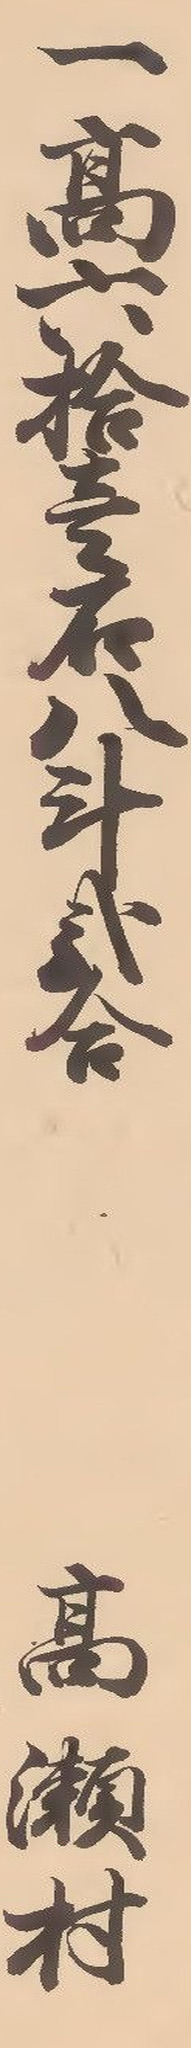一高六拾壱石八斗弐合高瀬村
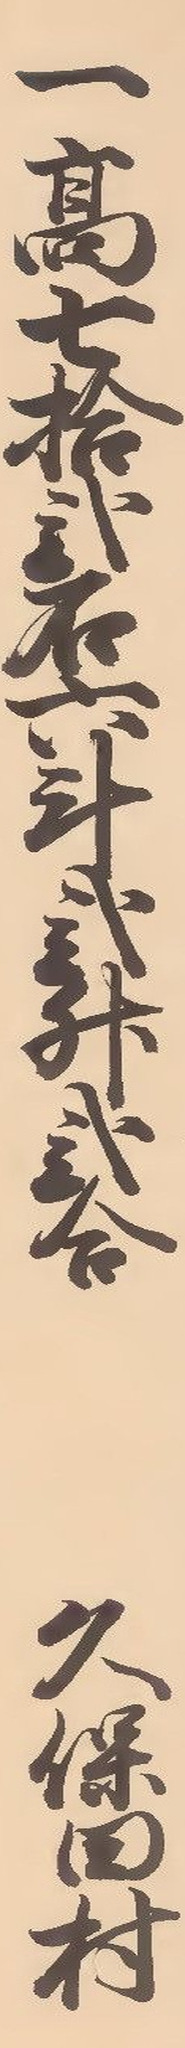一高七拾弐石六斗弐升弐合久保田村
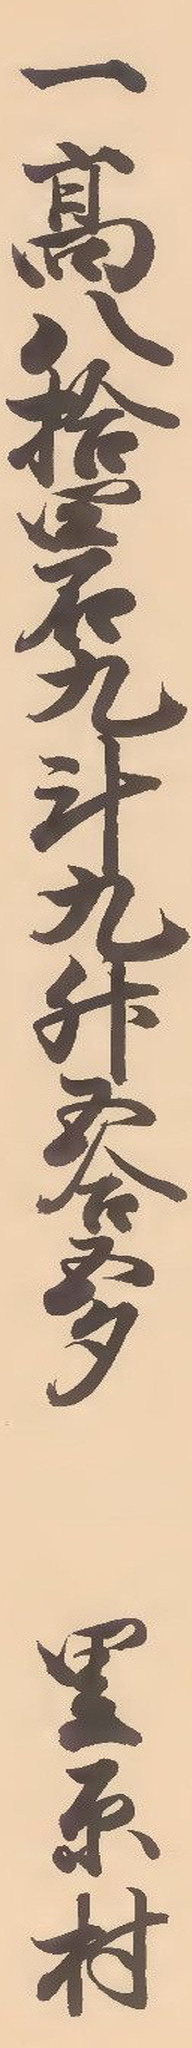一高八拾四石九斗九升五合五勺里原村
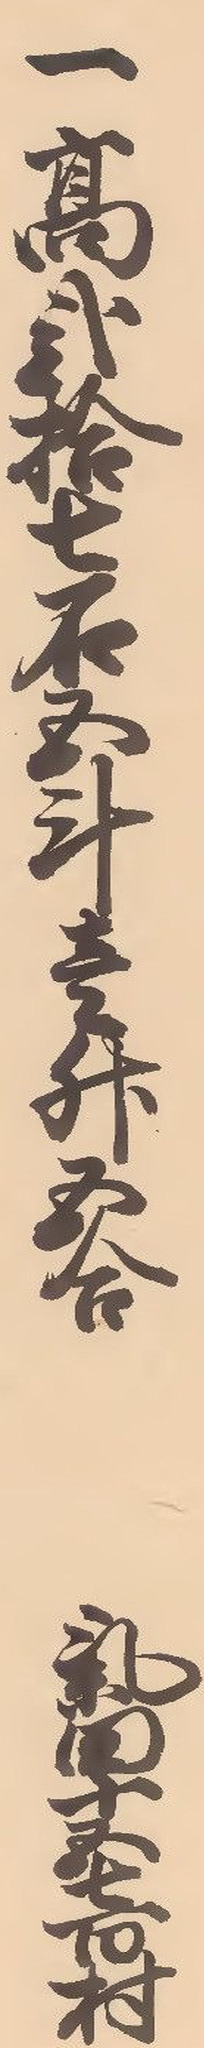一高弐拾七石五斗壱升五合気田十五七百村
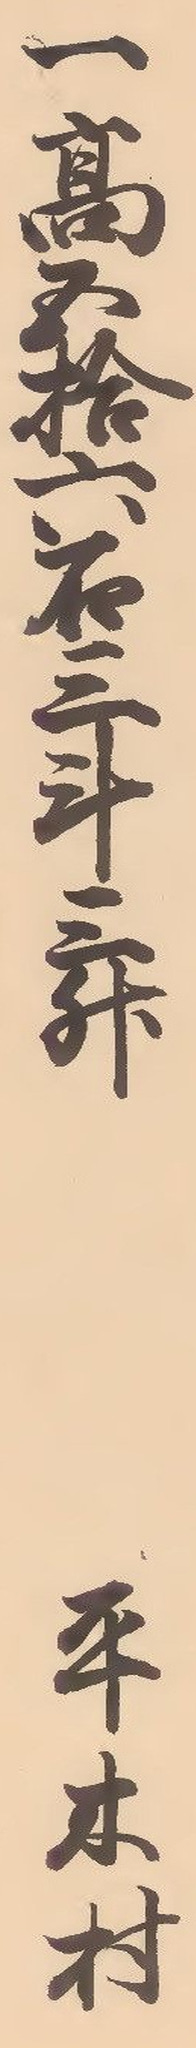一高五拾六石三斗三升平木村

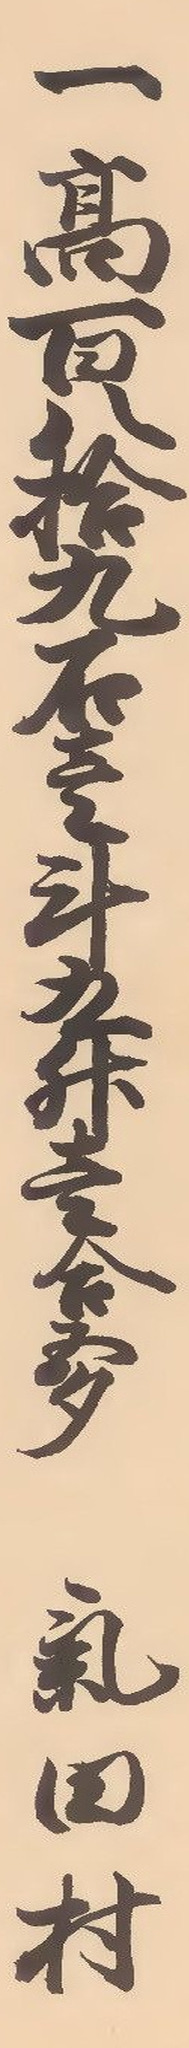一高百八拾九石壱斗九升壱合五勺気田村
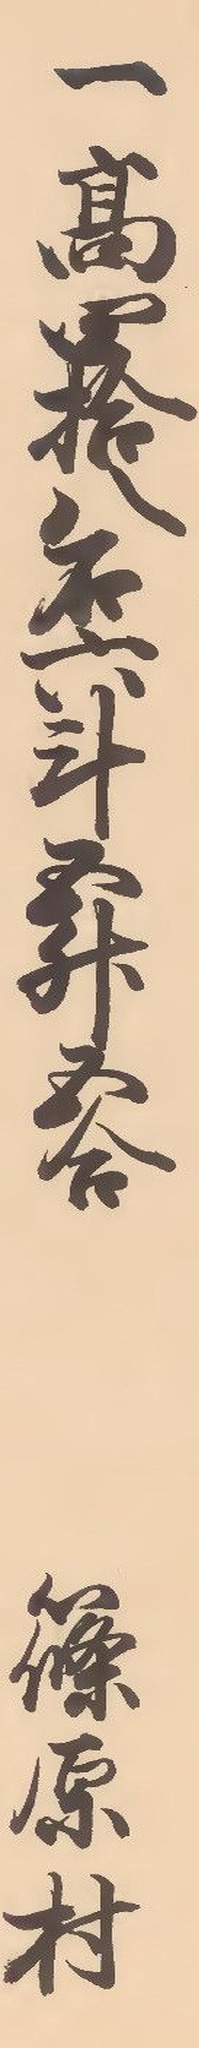一高四拾八石六斗五升五合篠原村
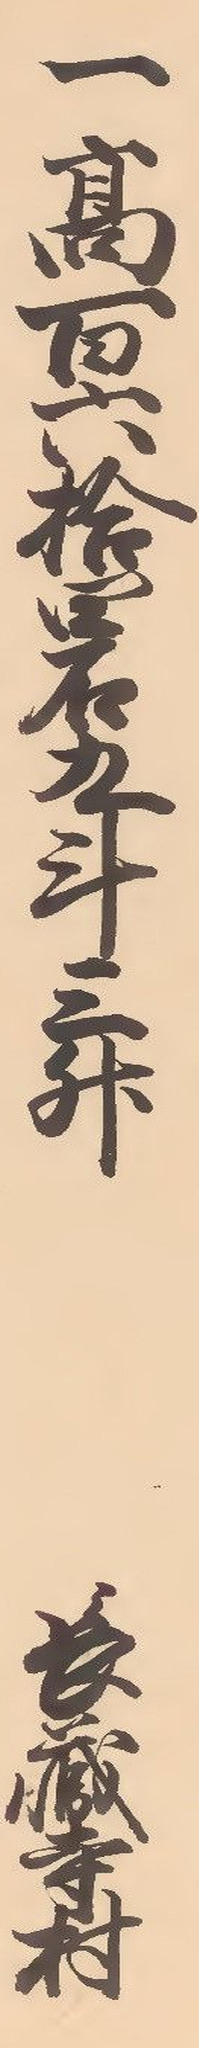一高百六拾四石九斗三升長蔵寺村
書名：遠江国郷帳
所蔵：国立公文書館 National Archives of Japan
